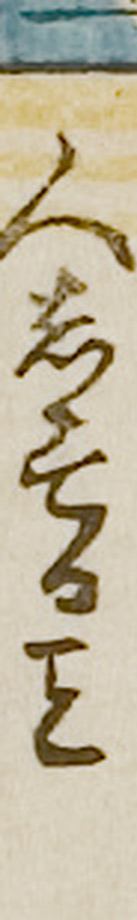人しすること
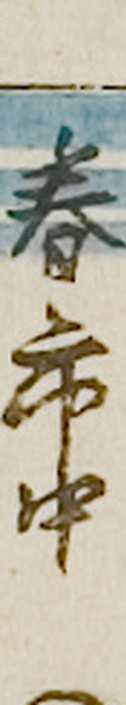春市中
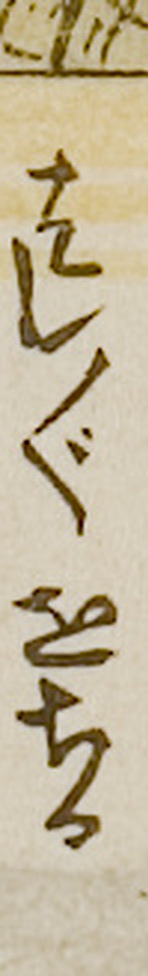はし〴〵をちる
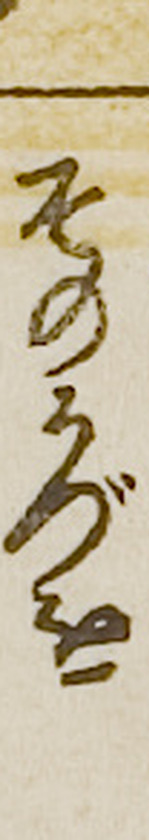そのかづを
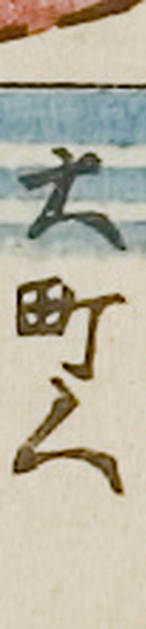大町人
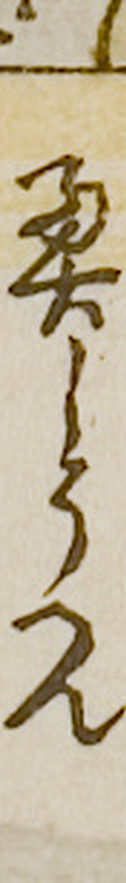奥しうへん
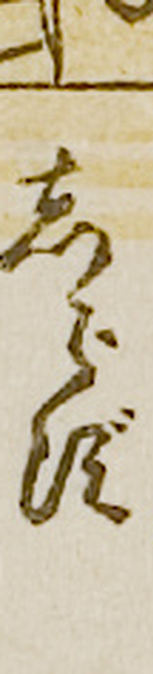しらず
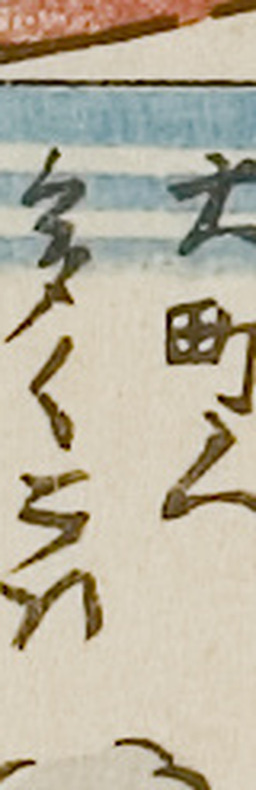多くこは
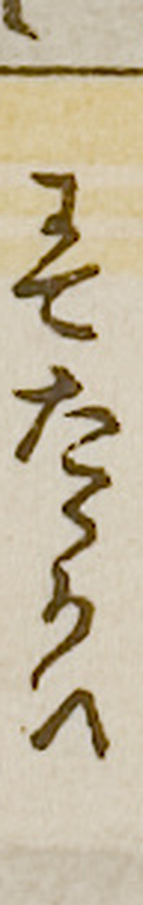にてたゝかひ
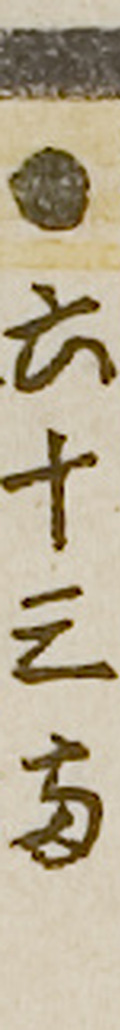●六十三両
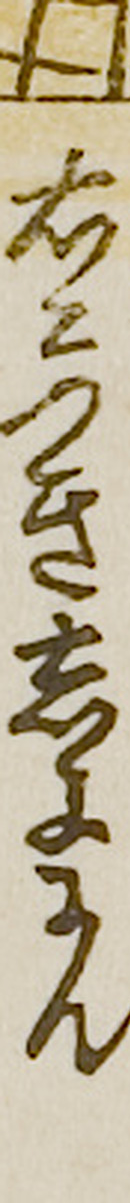右につきしよにん
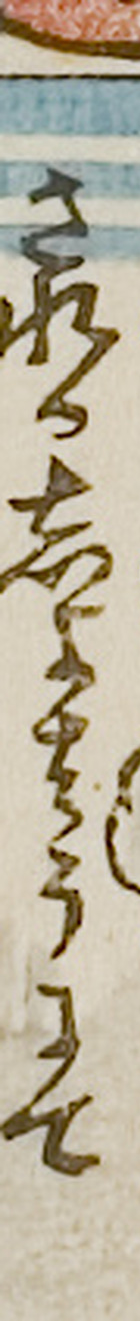されるしよはうにて
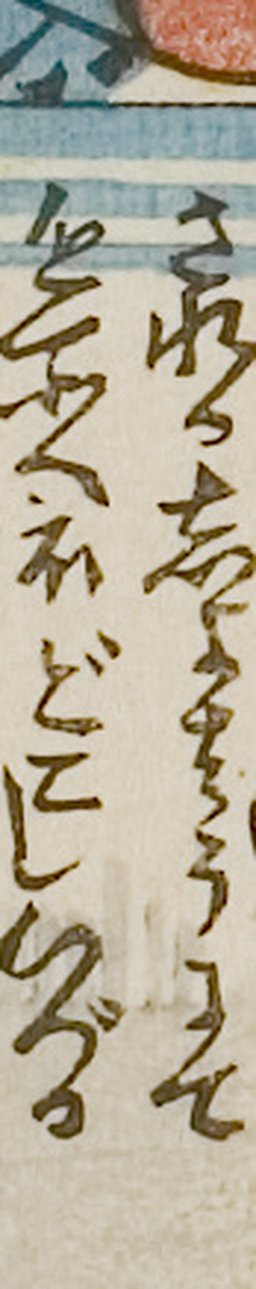近所へほどこしいづる
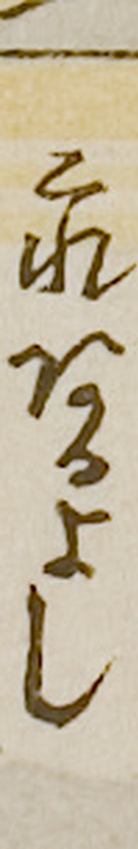これあるよし
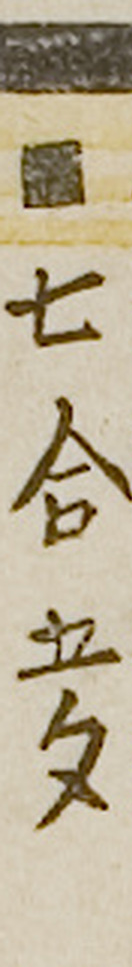七合五勺
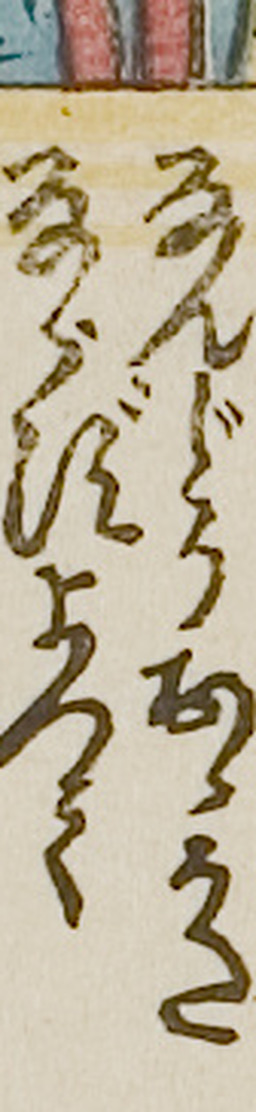ならずよつて
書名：嘉永年間より米相場直段并年代記書抜大新版
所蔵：東京大学総合図書館 General Library in the University of Tokyo, JAPAN
